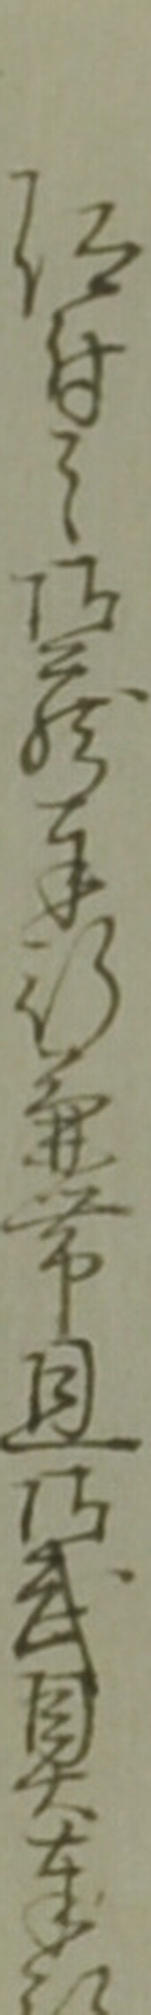仰付之御蔵奉行兼帯且御武具奉行
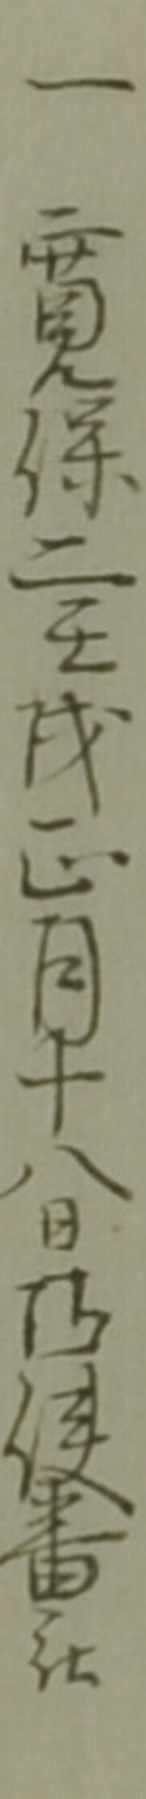一寛保二壬戌正月十八日御使番被
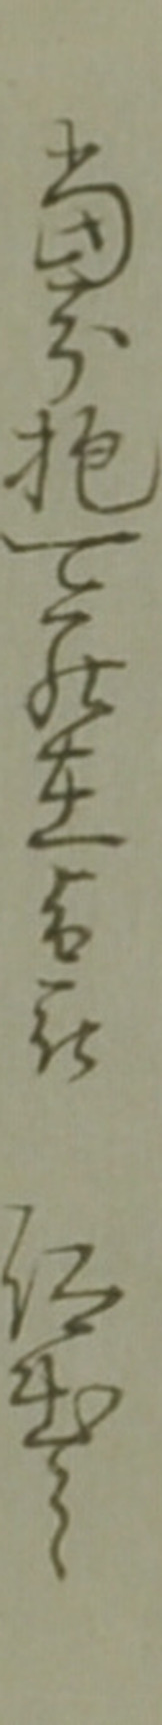当分抱可罷在旨被仰出之
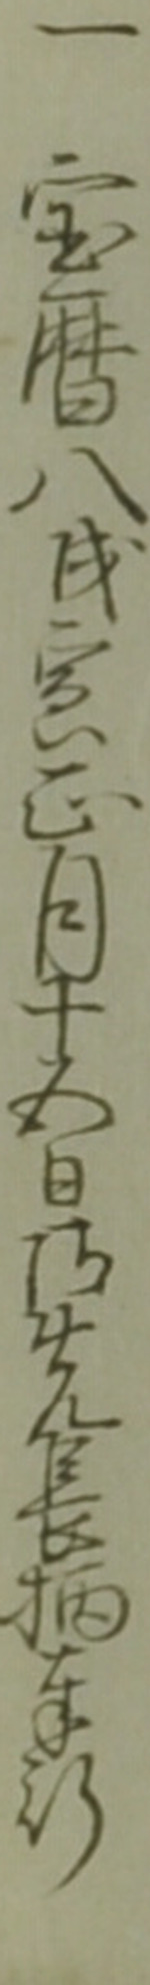一宝暦八戊寅正月十五日御先長柄奉行
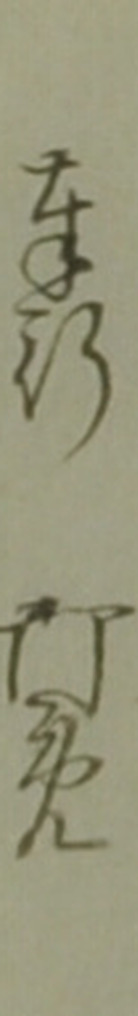奉行御免
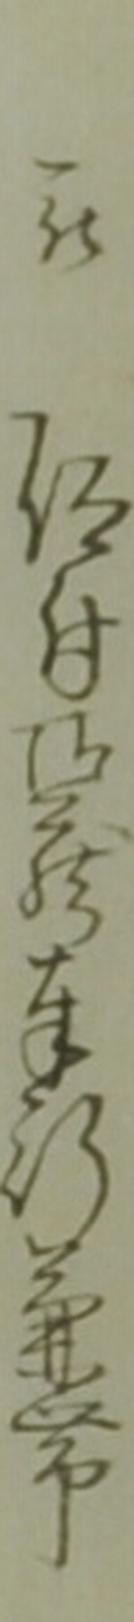被仰付御蔵奉行兼帯
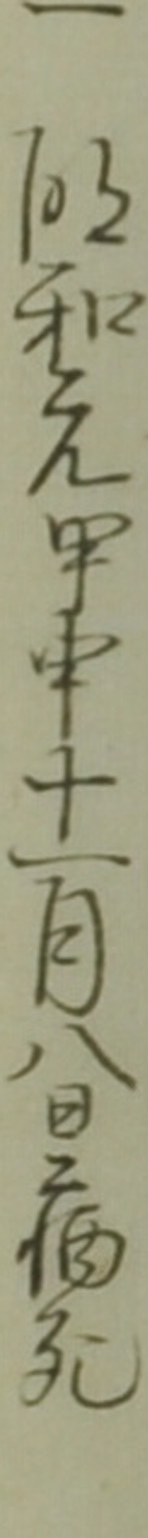一明和元甲申十一月八日病死

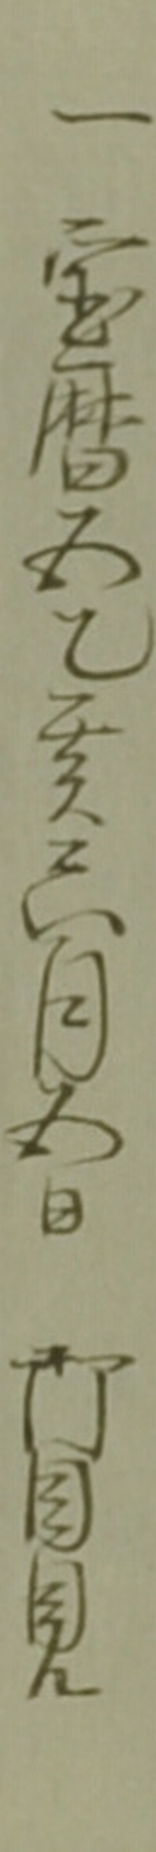一宝暦五乙亥六月五日御目見
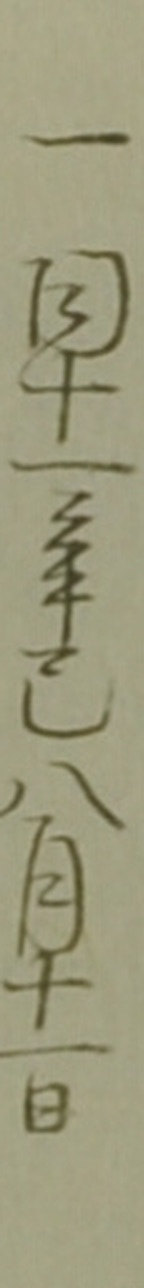一同十一辛巳八月十一日
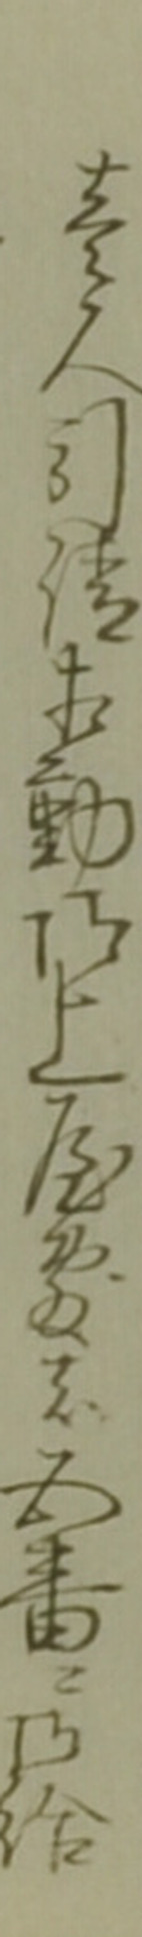壱人引請相勤御上屋敷者五番ニ御給
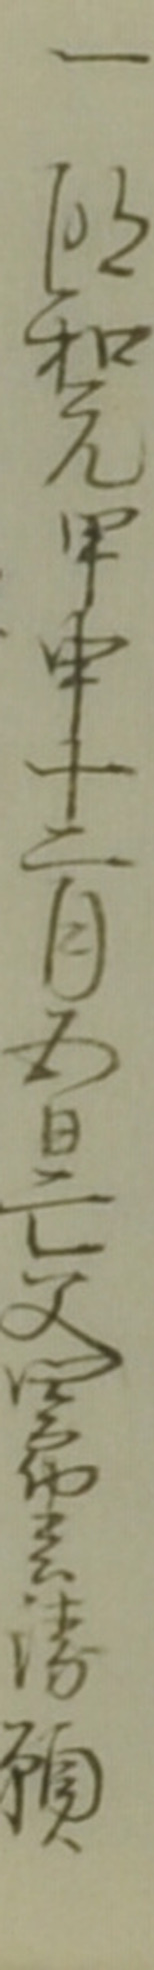一明和元甲申十二月五日亡父四郎兵衛願
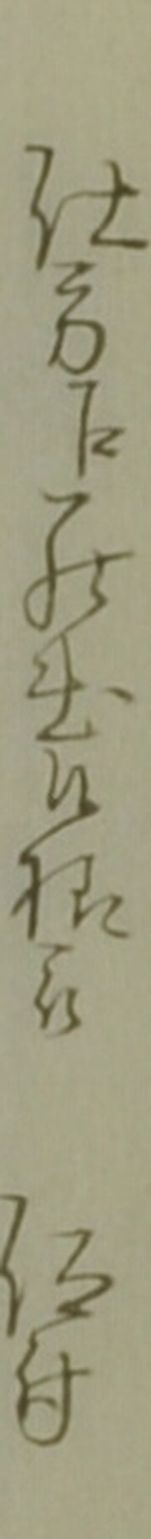仕方江罷出候様被仰付
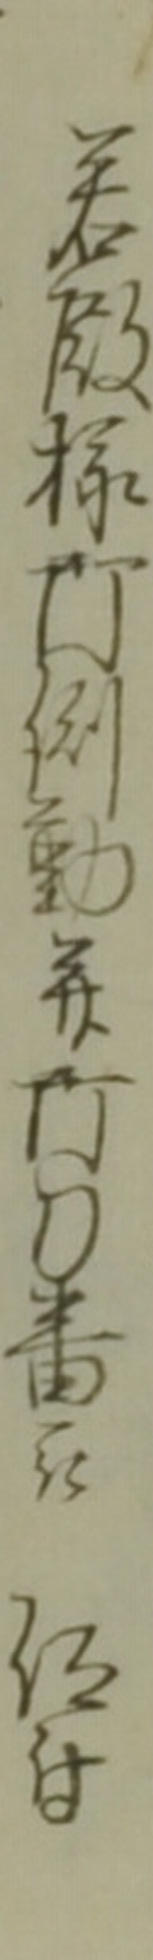若殿様御側勤并御刀番被仰付
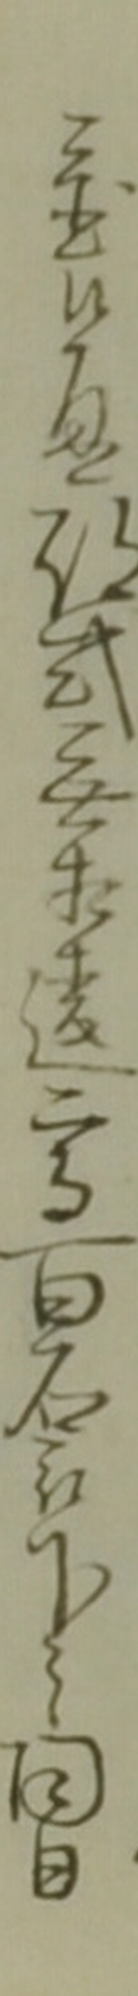置候通跡式無相違高百石被下之同日
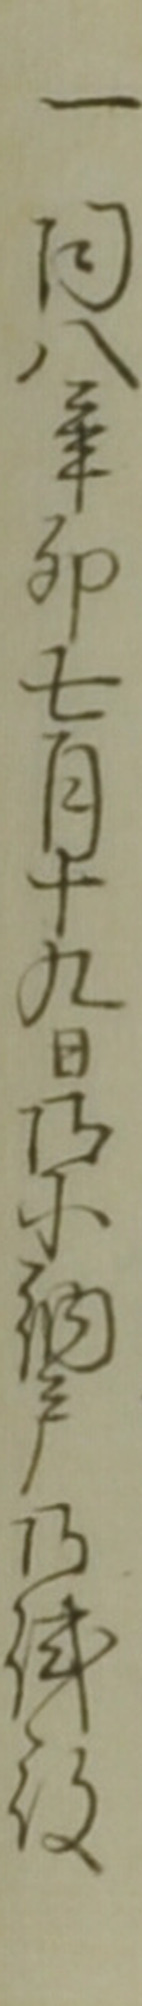一同八辛卯七月十九日御小納戸御試役
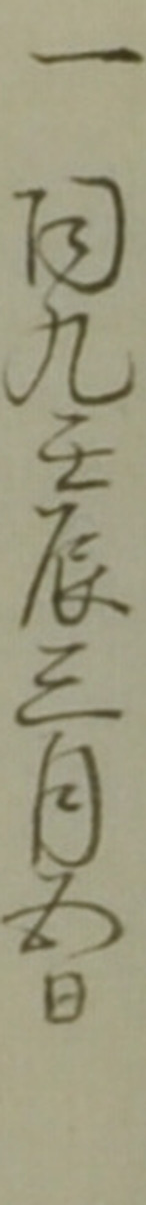一同九壬辰三月五日
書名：給人諸士勤仕録（三）
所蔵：伊那市立高遠町図書館・合同会社AMANE
